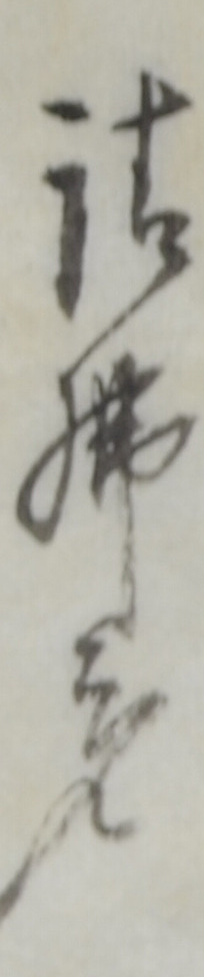請払覚
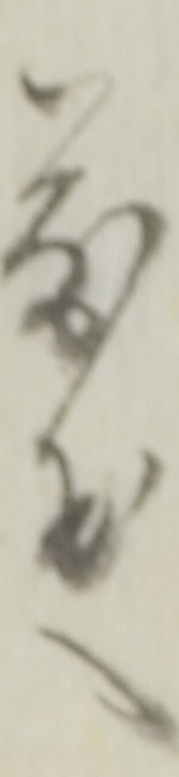万屋へ
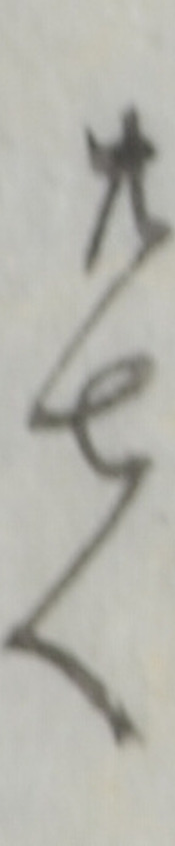廿七文
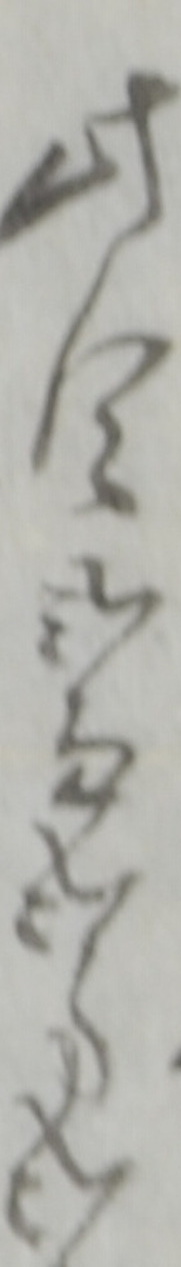此金弐両弐分弐朱ト
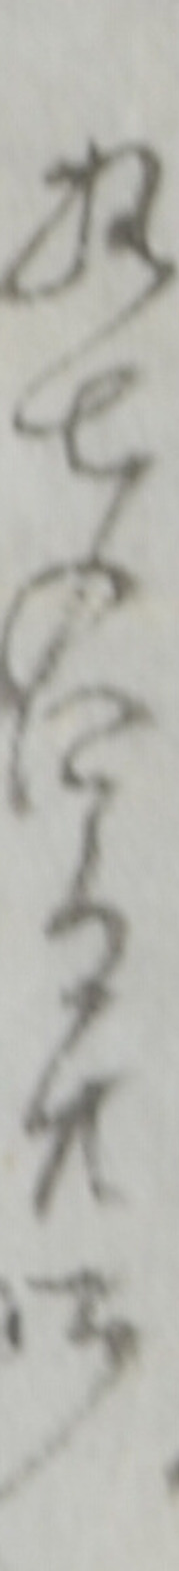拾七貫四百廿四文

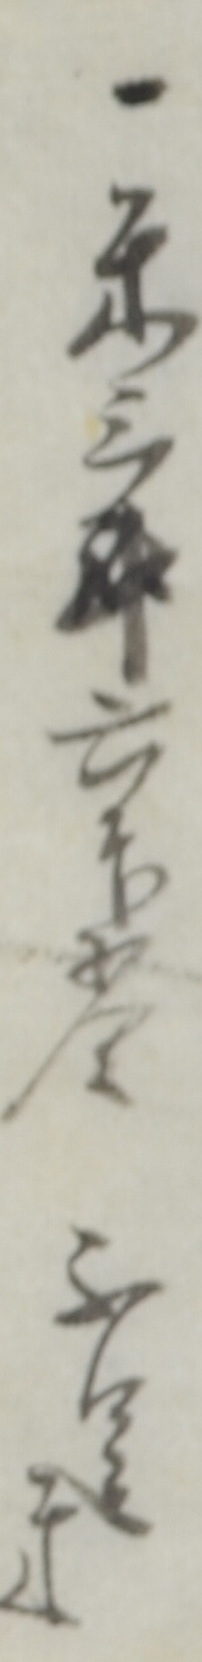一米三斗六升五合不足
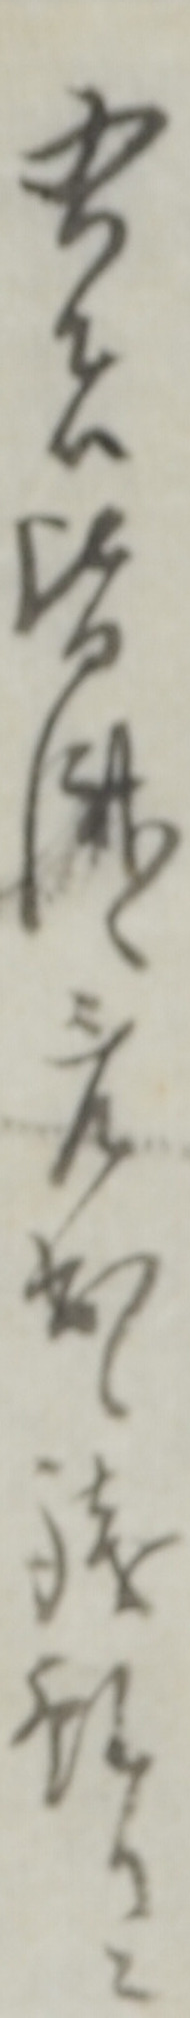右者皆済へ差出候残預りと
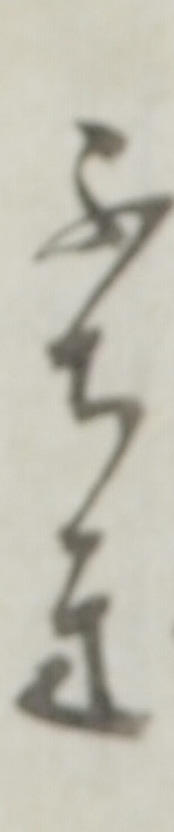ふち米
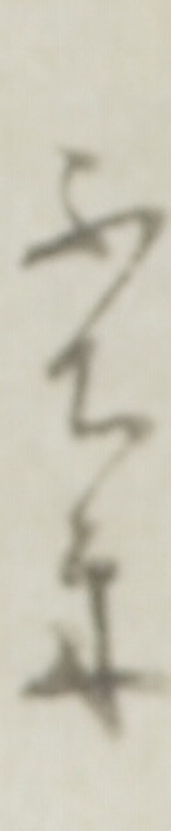ふち米
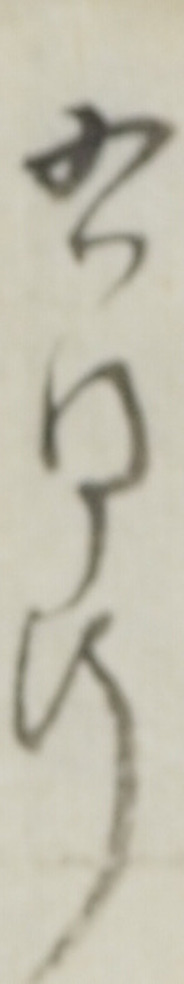右同断
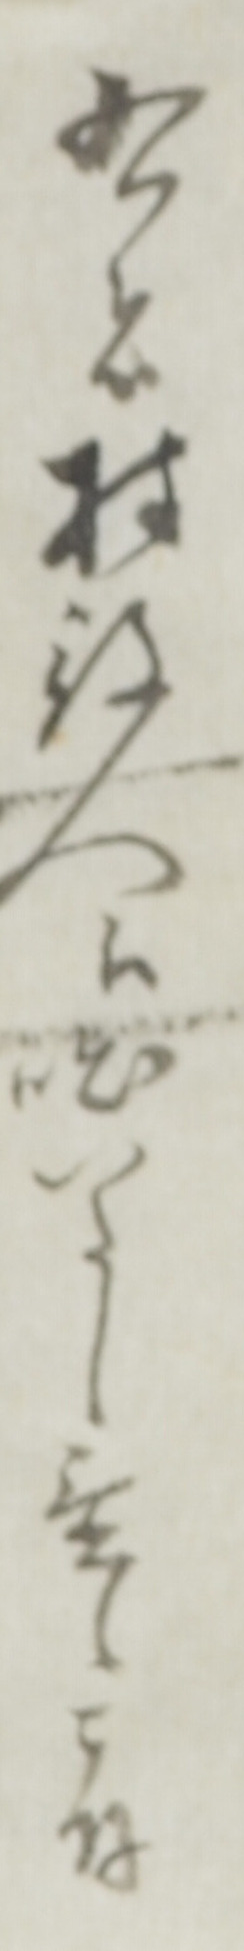右者村役人江咄いたし置候ニ付
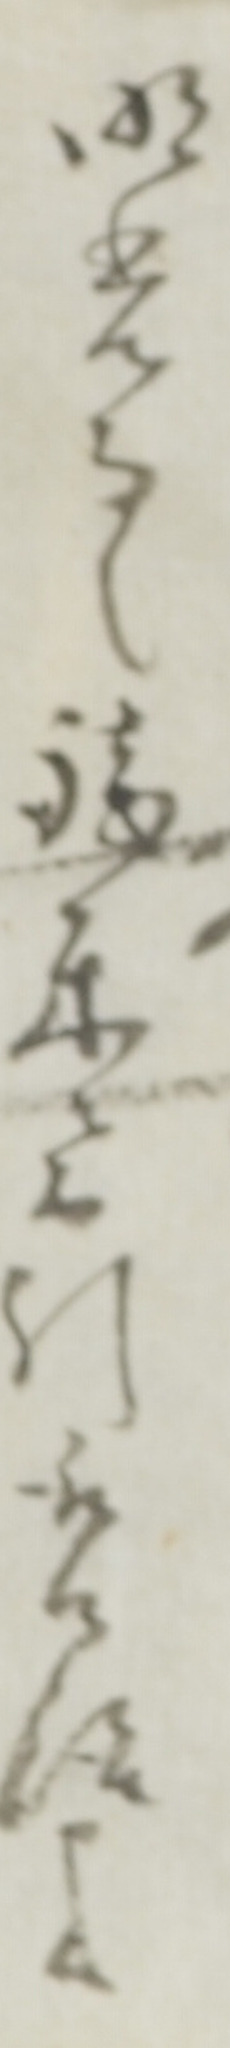明光寺之残米二而引取候趣申上
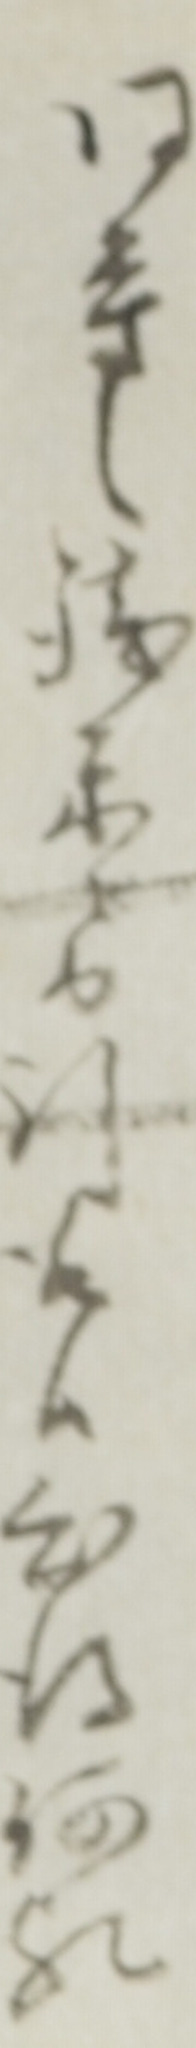同寺之残米二而引取候心得何歟
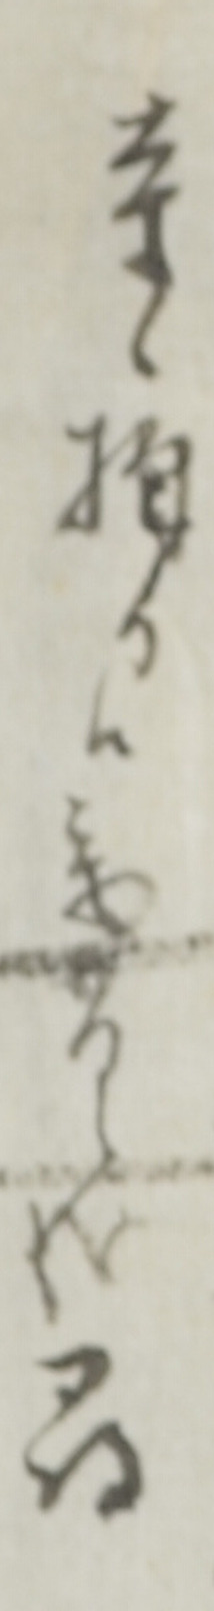寺之抱り候義有之哉尋
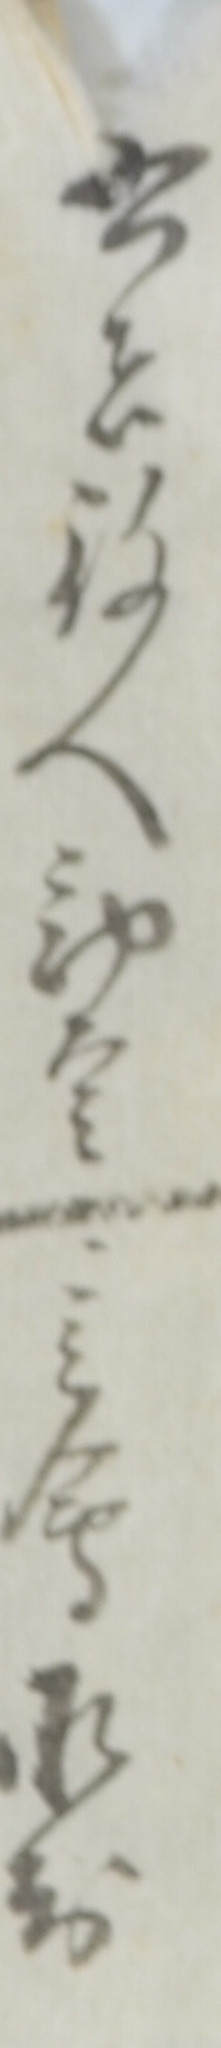右者役人勘定二之会承知
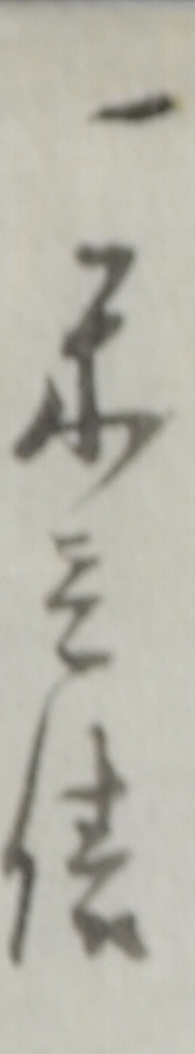一米壱俵
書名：（金銭書上控）
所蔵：伊那市立高遠町図書館・合同会社AMANE
